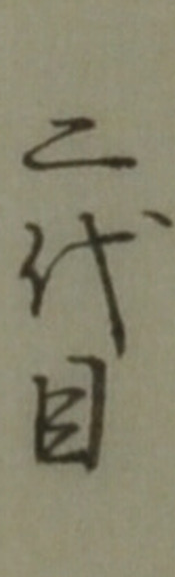二代目
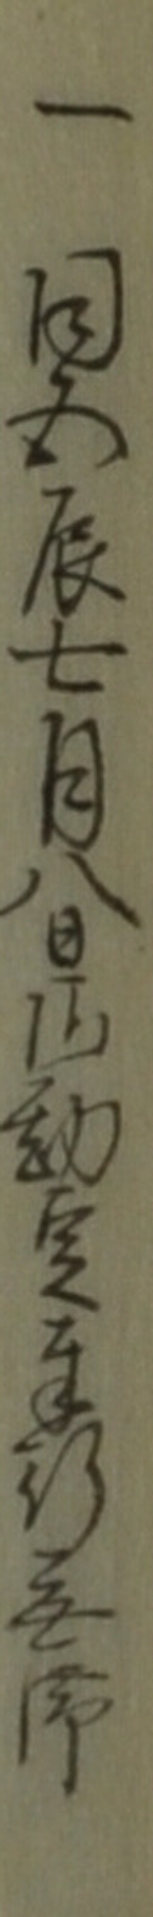一同五辰七月八日御勘定奉行無滞
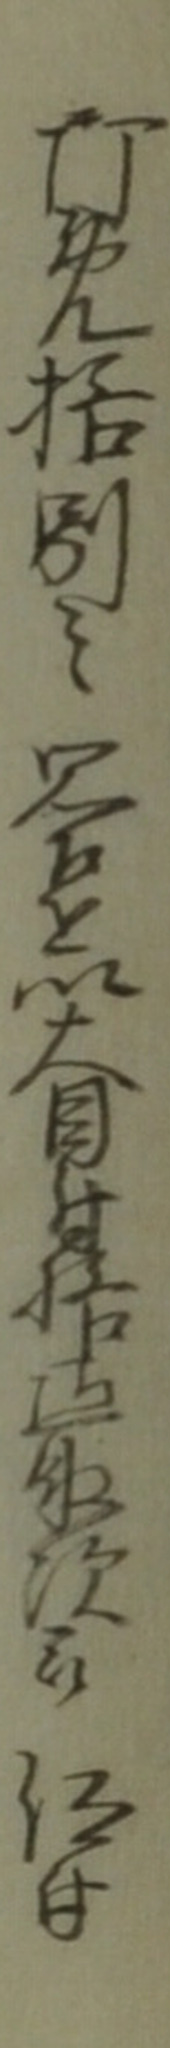御免格別之思召を以大目付格御取次被仰付
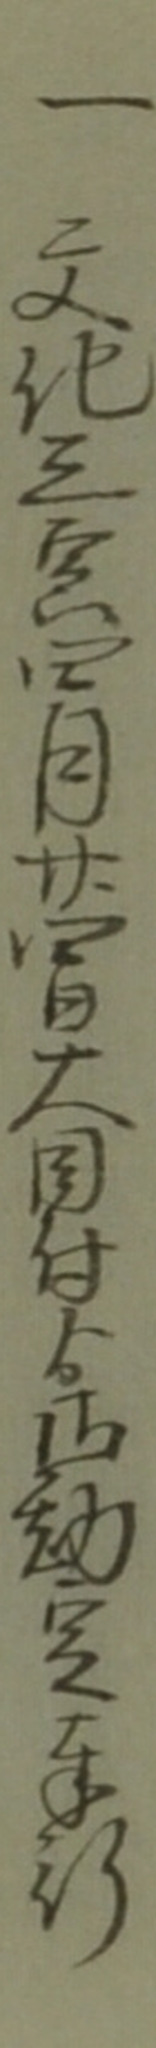一文化三寅四月廿四日大目付ゟ御勘定奉行
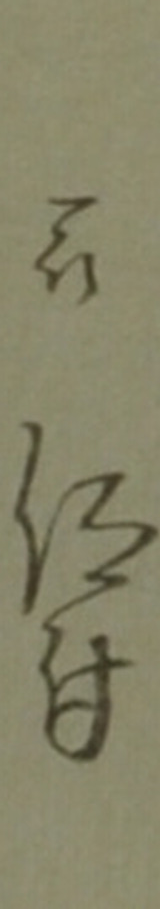被仰付
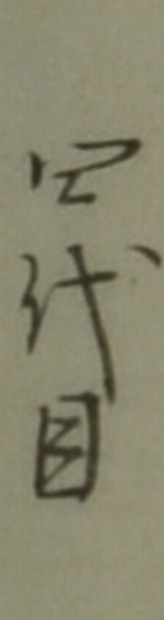四代目
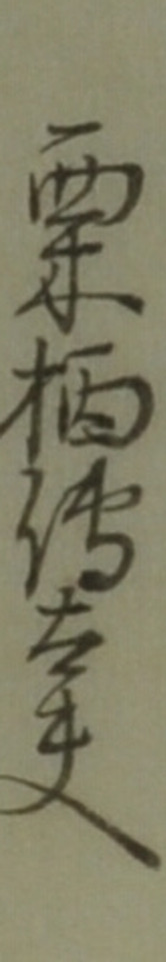栗栖傳太夫
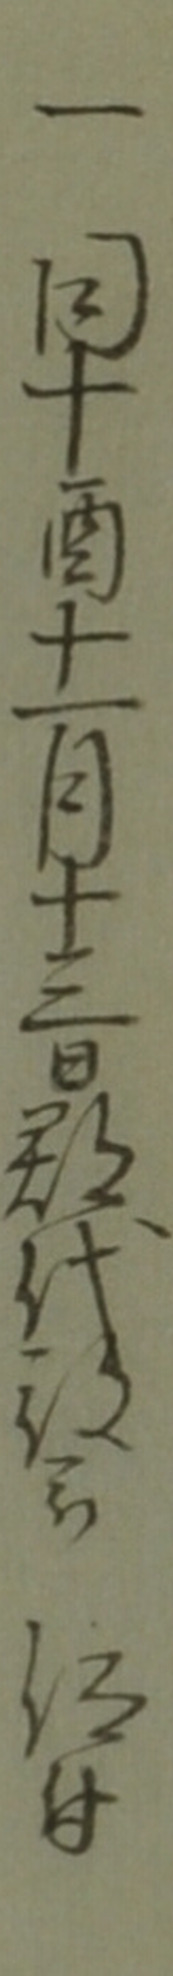一同十酉十一月十三日郡代役被仰付
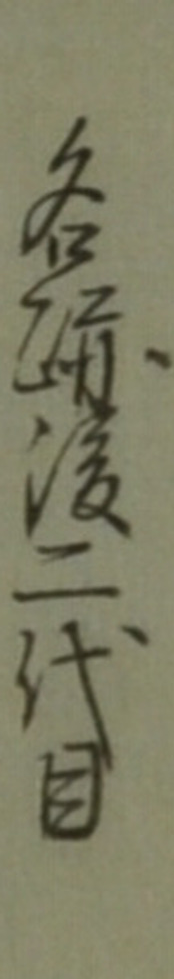名跡後二代目
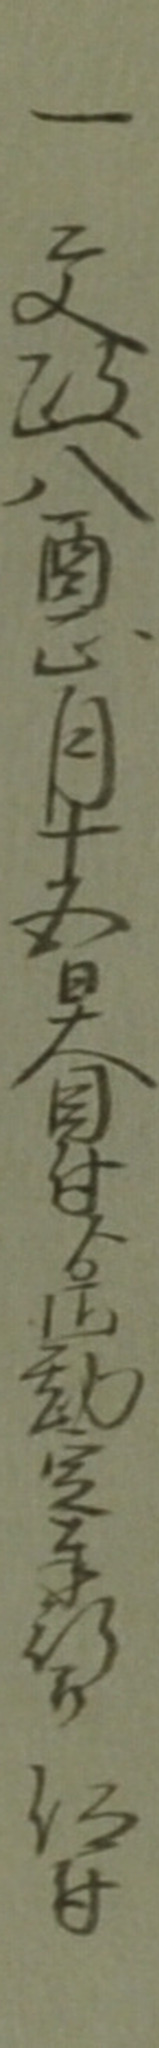一文政八酉正月十五日大目付ゟ御勘定奉行被仰付
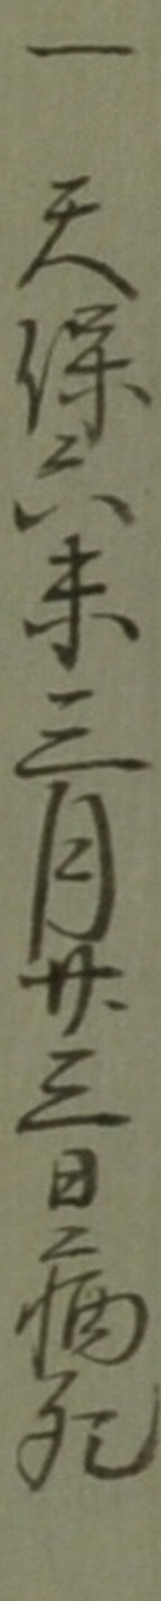一天保六未三月廿三日病死
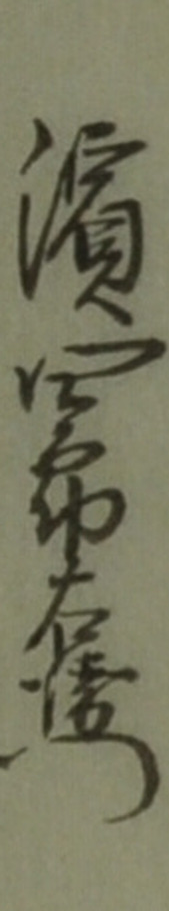濱四郎右衛門
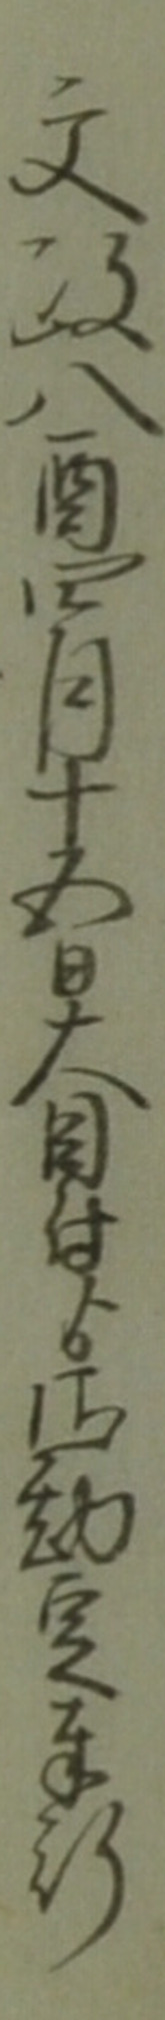一文政八酉四月十五日大目付ゟ御勘定奉行
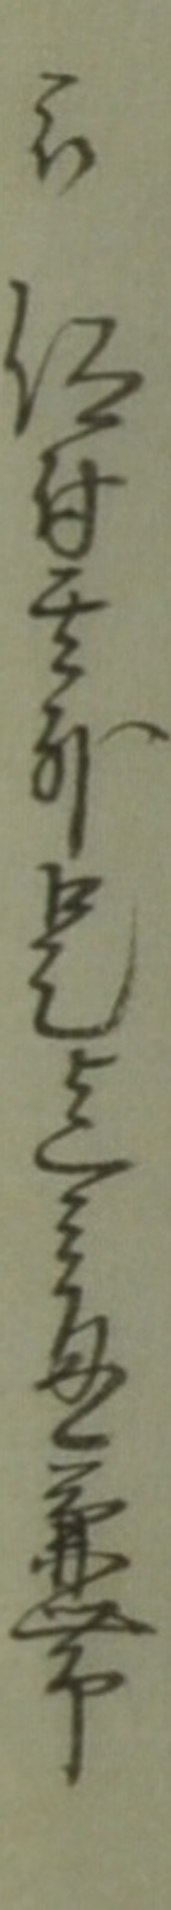被仰付其外是迄之通兼帯
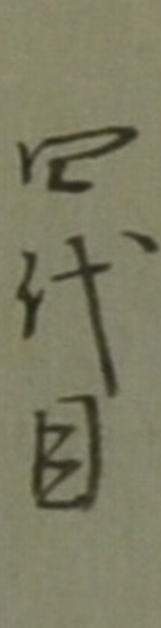四代目
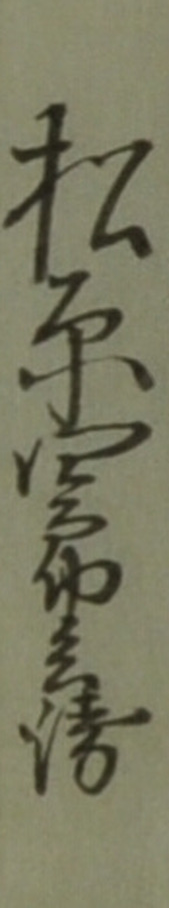松原四郎兵衛
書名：諸御役代々録（三）
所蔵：伊那市立高遠町図書館・合同会社AMANE
